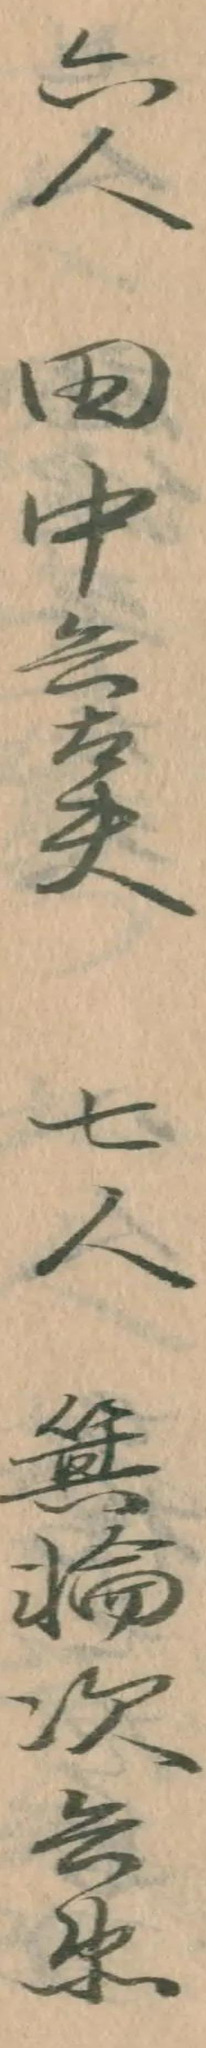六人田中兵太夫七人箕輪次兵衛
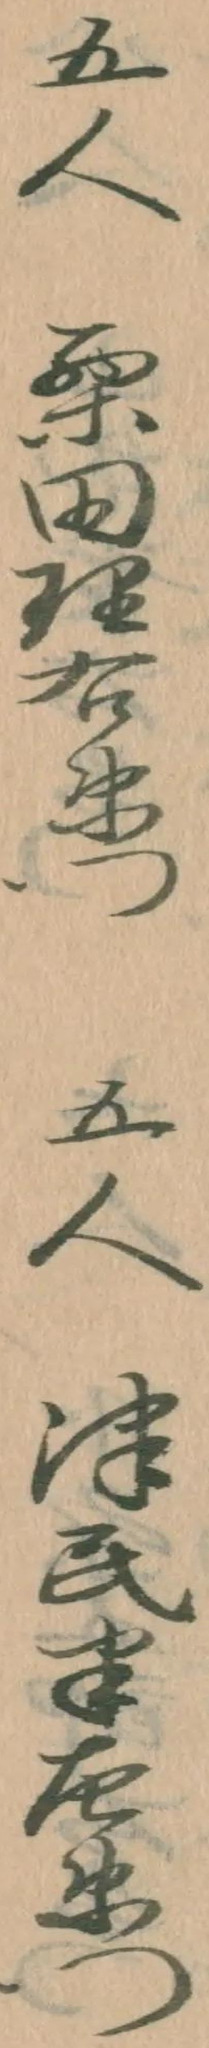五人栗田理右衛門五人津民半左衛門
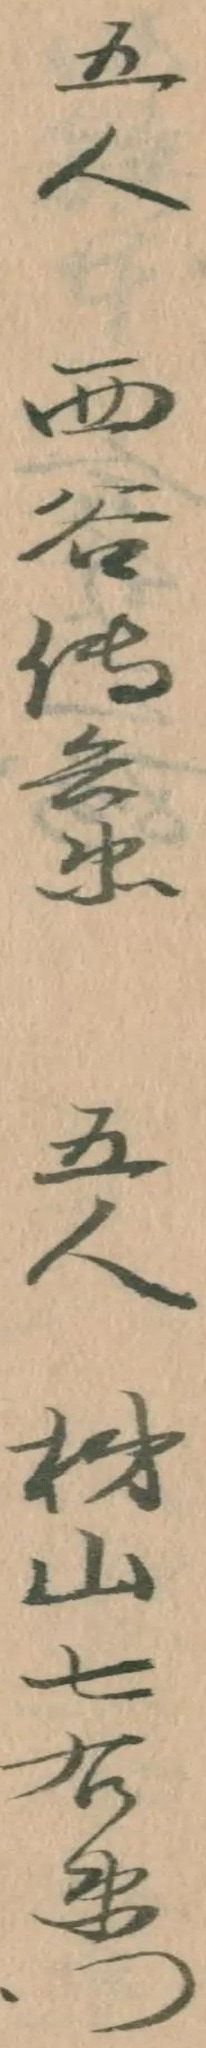五人西谷伝兵衛五人梯山七右衛門
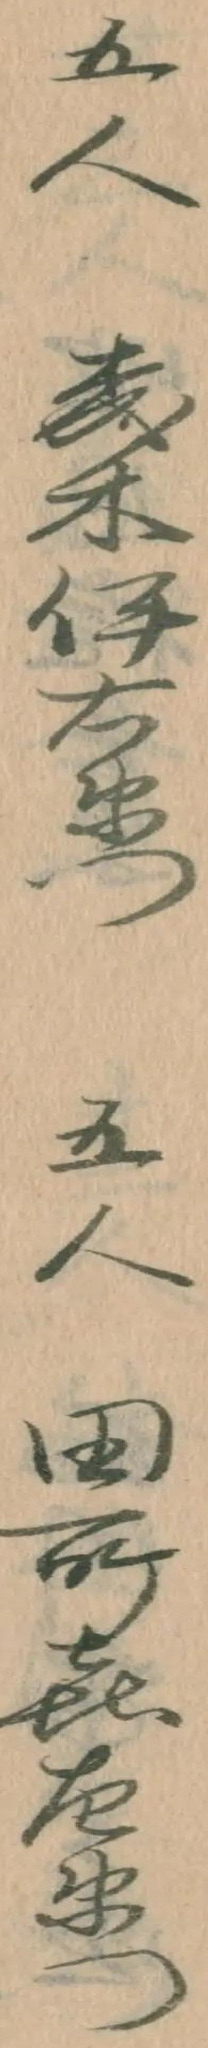五人森木伊右衛門五人田所喜左衛門
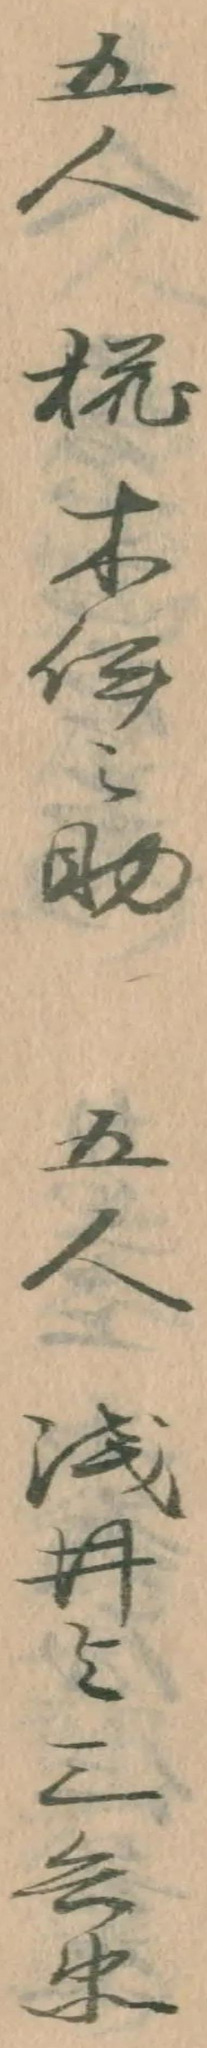五人椛木伊之助五人浅井与三兵衛
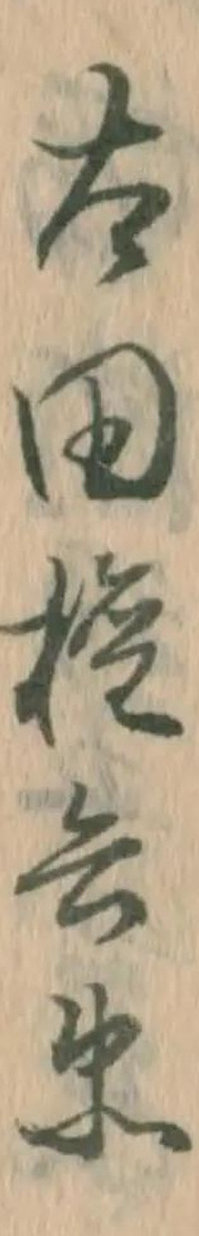太田権兵衛
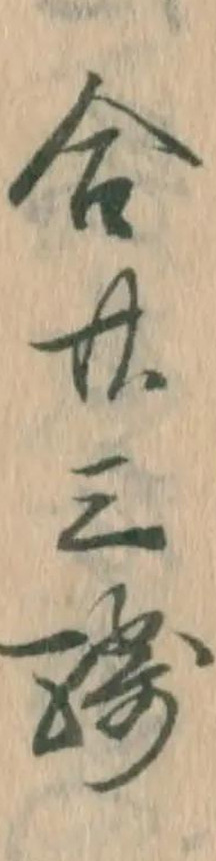合廿三騎
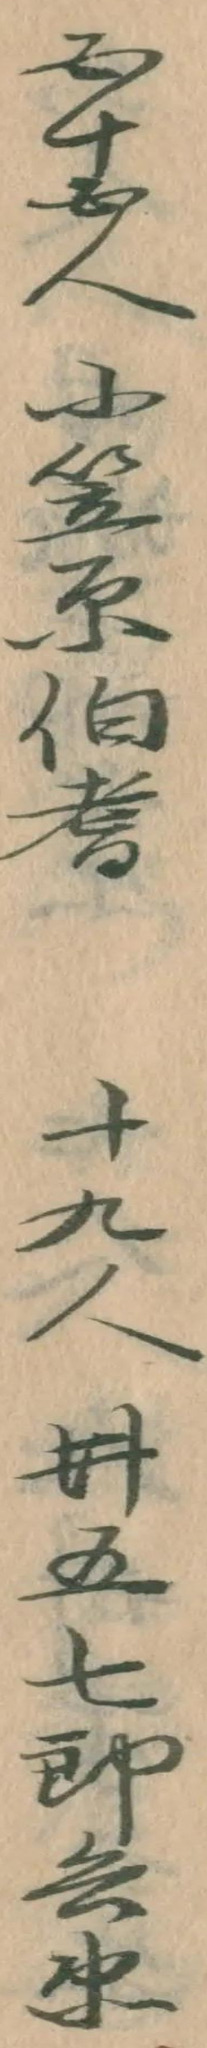五十五人小笠原伯耆十九人井五七郎兵衛
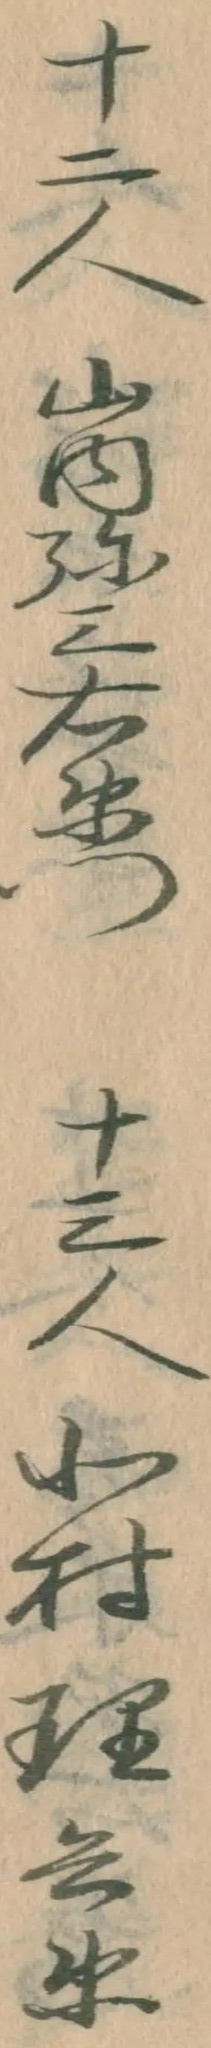十二人山田弥三右衛門十三人北村理兵衛
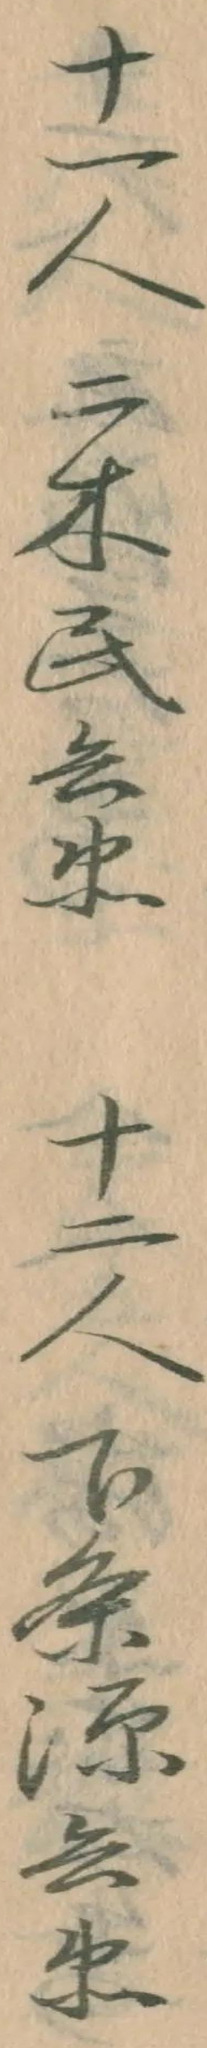十一人二木民兵衛十二人下条源兵衛
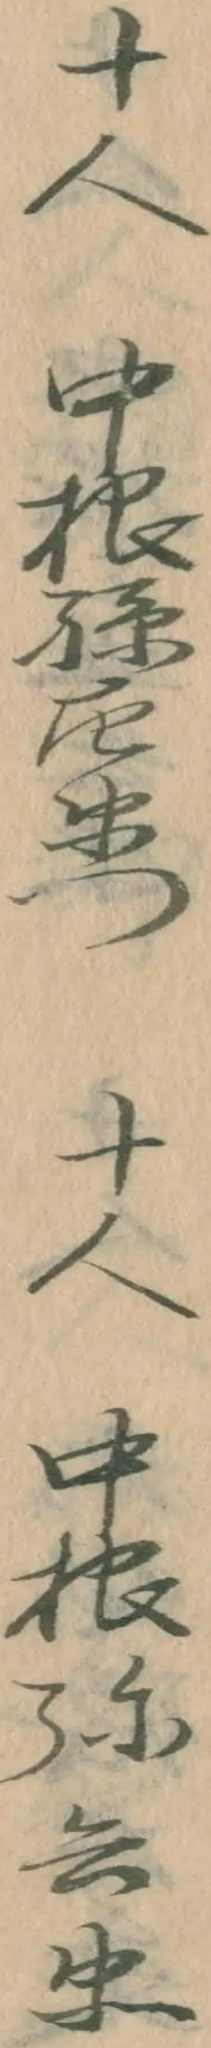十人中根孫左衛門十人中根弥兵衛

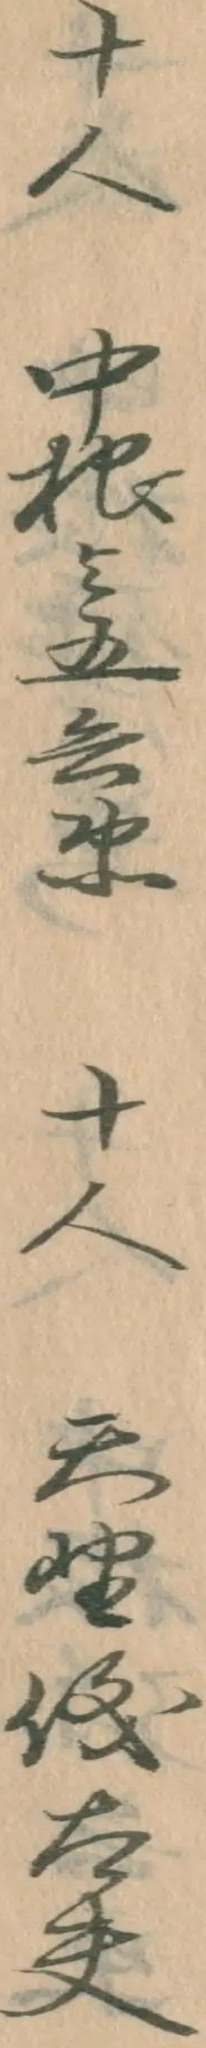十人中根与五兵衛十人天野儀太夫
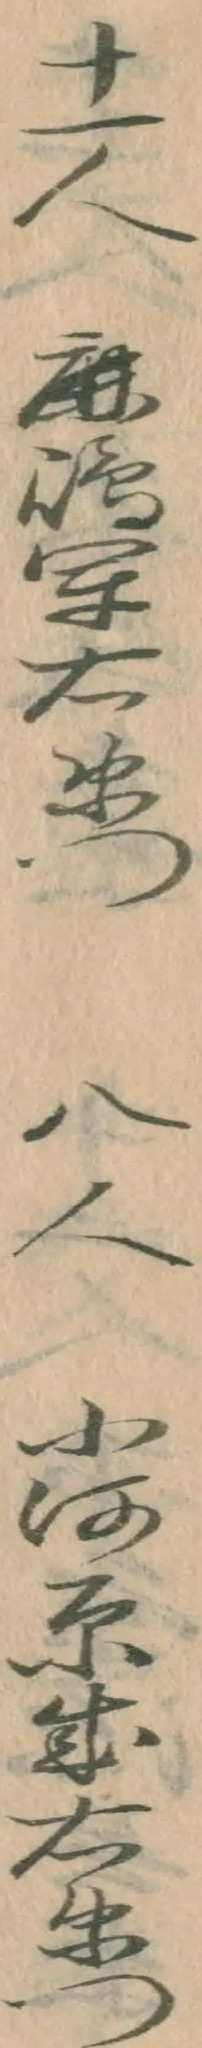十一人鹿島関右衛門八人小河原成右衛門
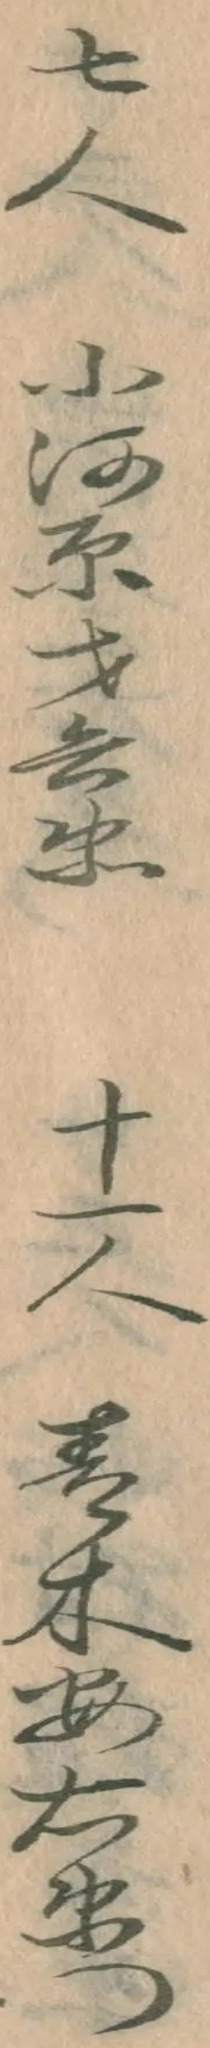七人小河原才兵衛十一人青木安右衛門
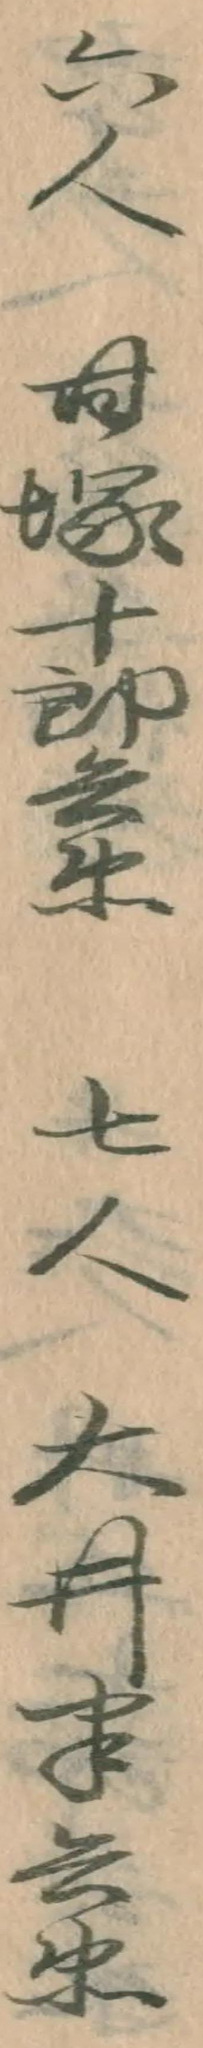六人甘塚十郎兵衛七人大井半平衛
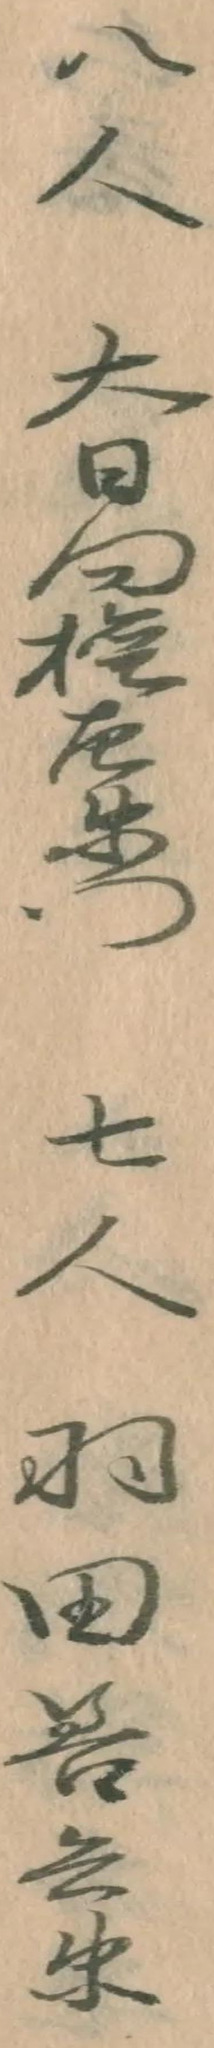八人大日向権左衛門七人羽田善兵衛
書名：切支丹御退治記 49巻. [6]
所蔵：国立国会図書館 National Diet Library, JAPAN
